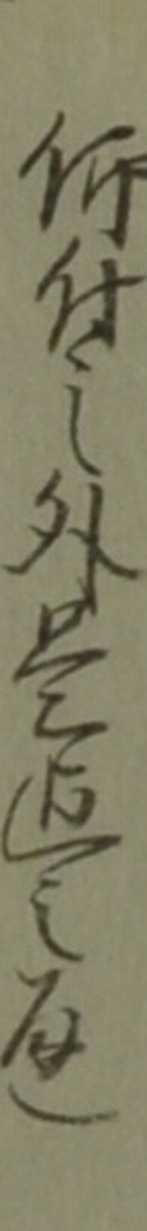仰付之外是迄之通
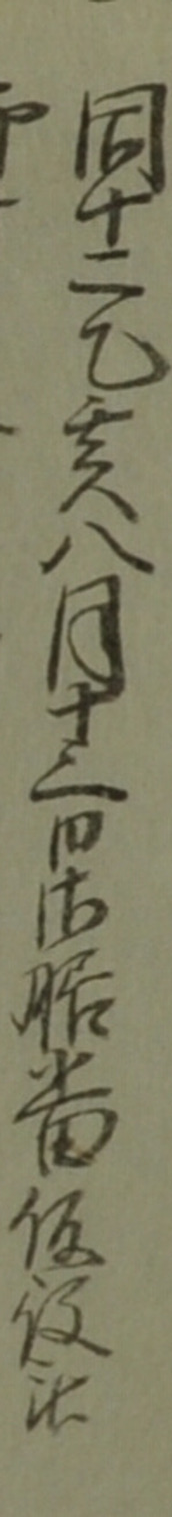一同十二乙亥八月十三日御膳番仮役被
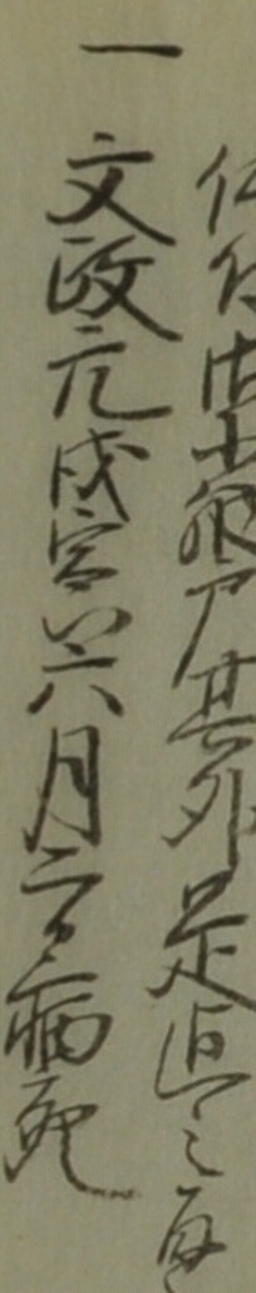一文政元戊寅六月二日病死
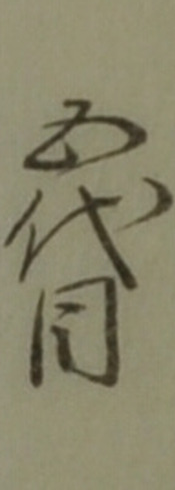五代目
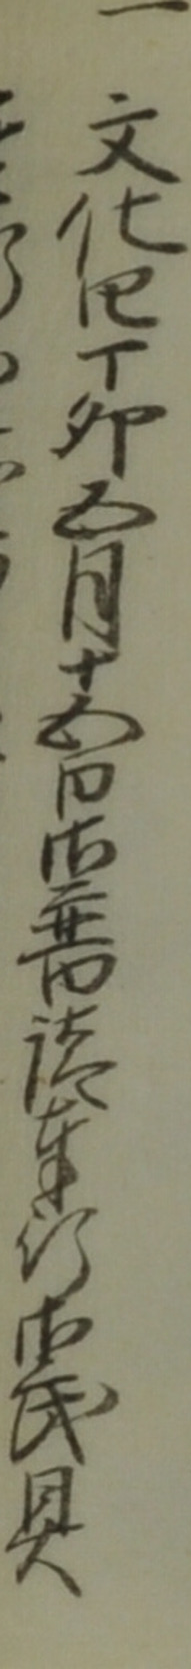一文化四丁卯五月十五日御普請奉行御武具
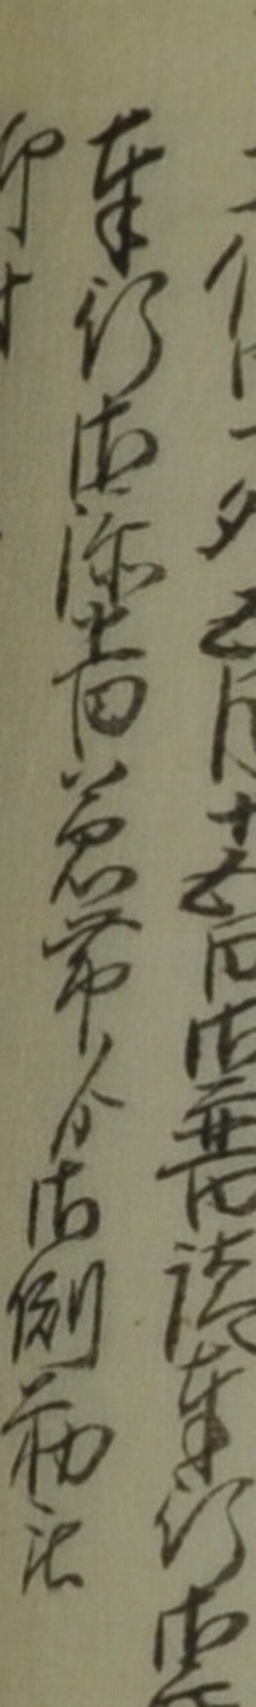奉行御添番兼帯ゟ御側勤被
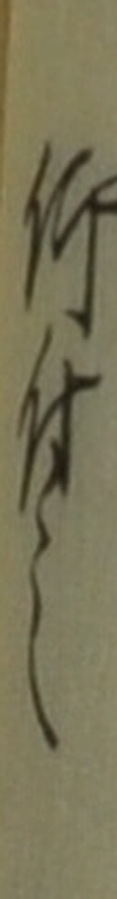仰付之
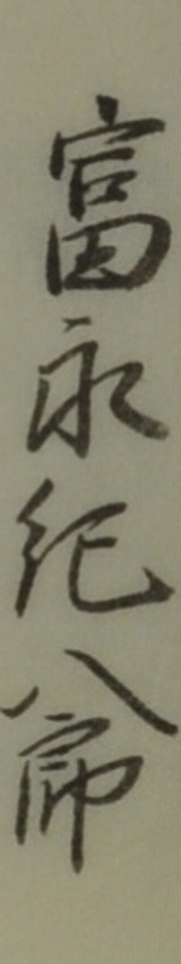富永紀八郎
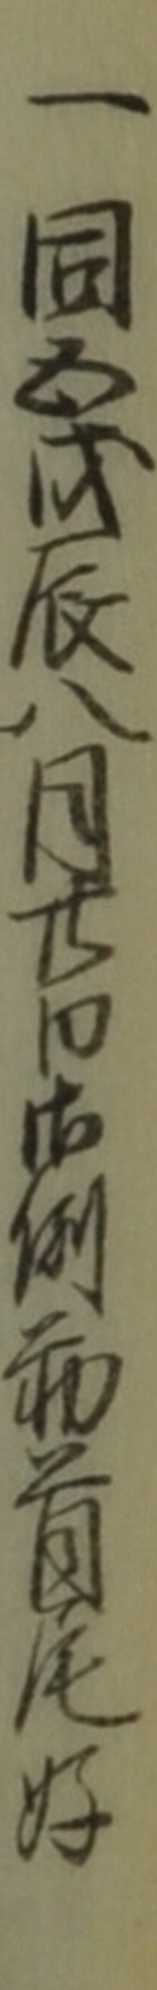一同五戊辰八月廿日御側勤首尾好
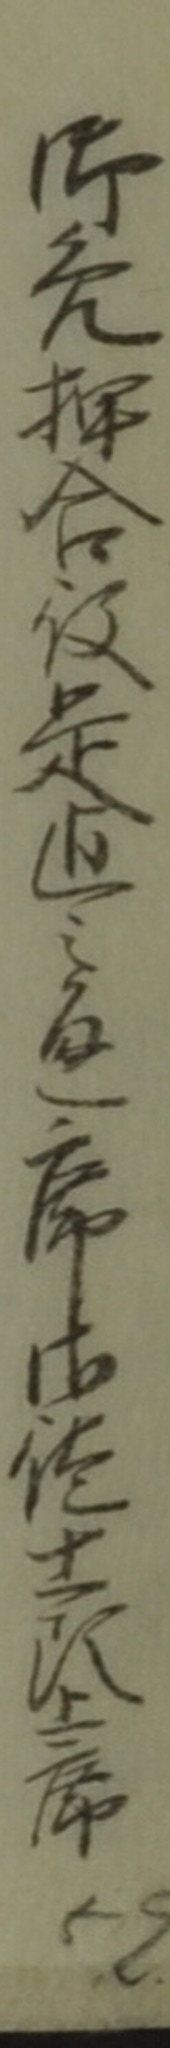御免押合役是迄之通席御徒士頭上席
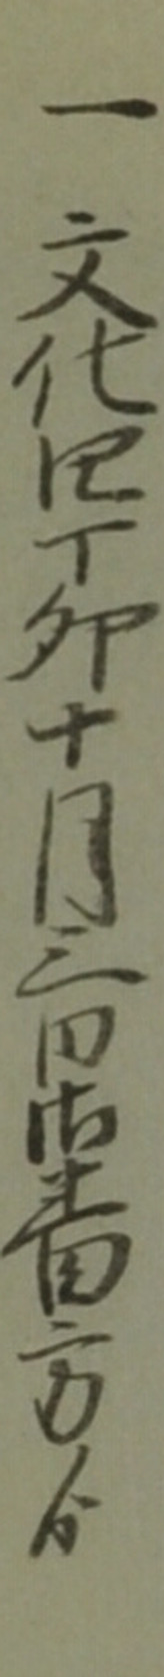一文化四丁卯十月三日御番方ゟ
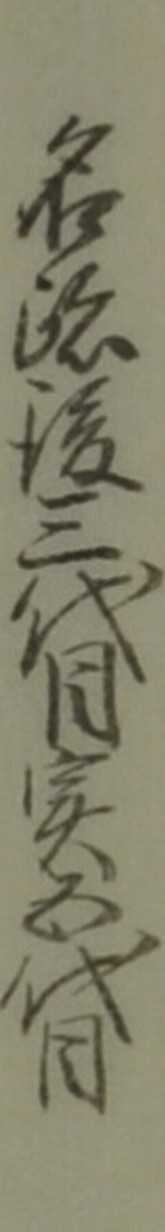名跡後三代目実五代目
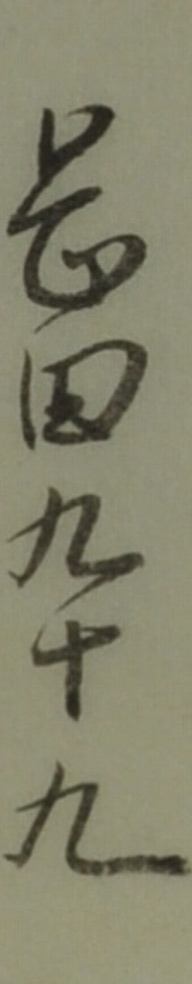岡田九十九
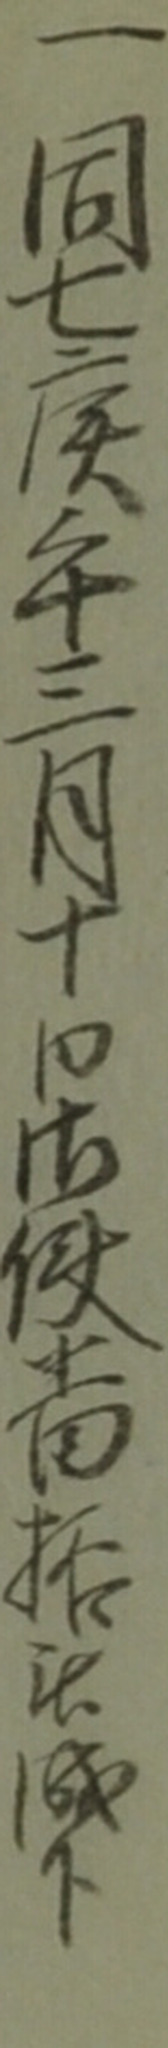一同七庚午三月十日御使番格被成下
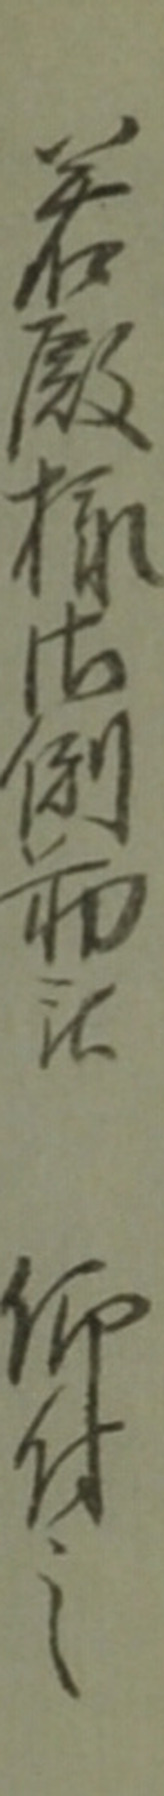若殿様御側勤被仰付之
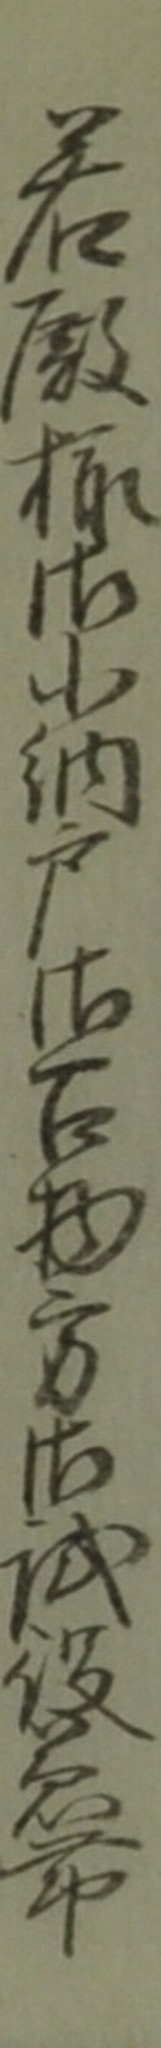若殿様御小納戸御召物方御試役兼帯
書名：諸御役代々録（五）
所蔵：伊那市立高遠町図書館・合同会社AMANE
